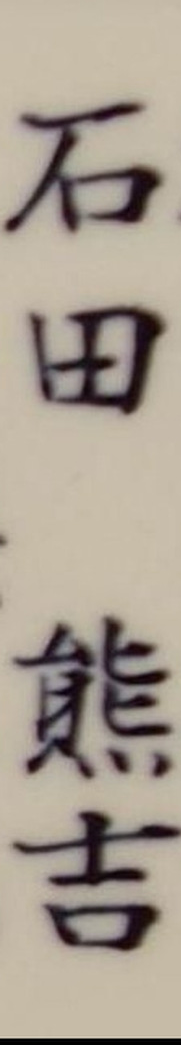石田熊吉
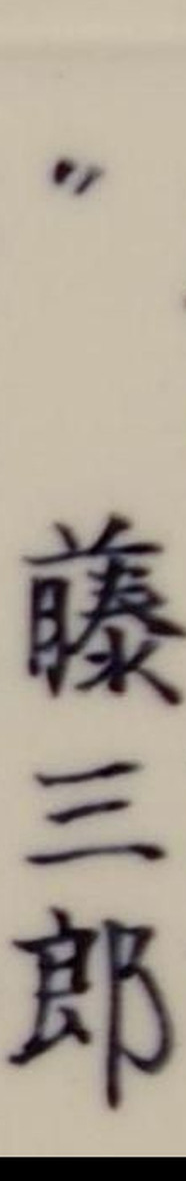藤三郎
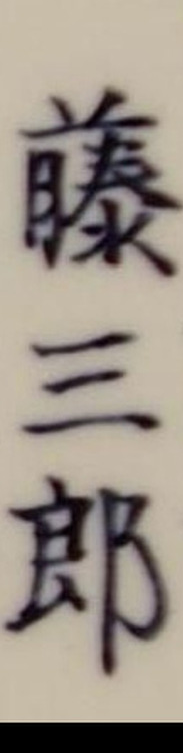藤三郎
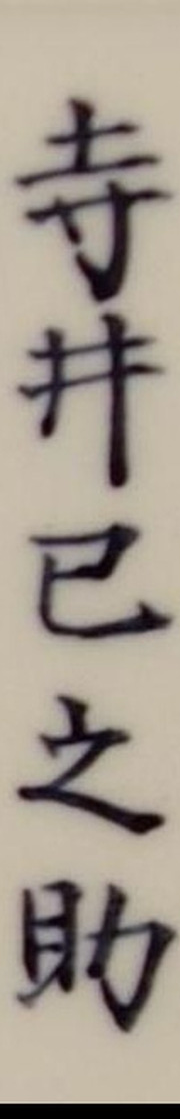寺井巳之助
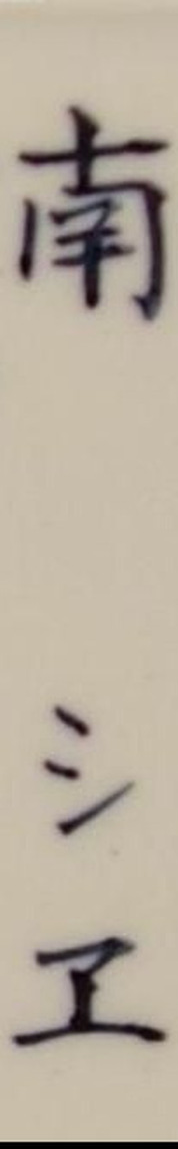南シエ
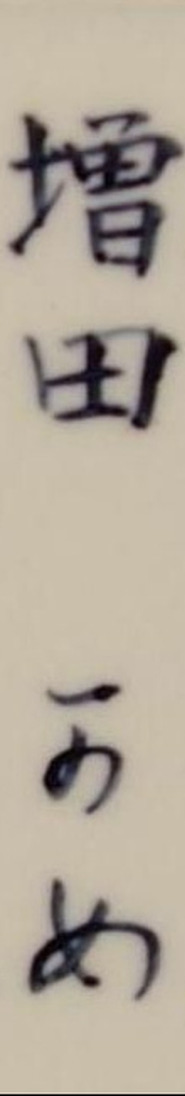増田かめ
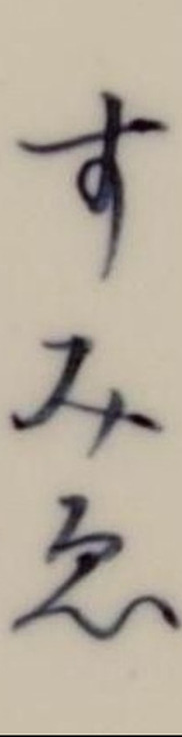すみえ
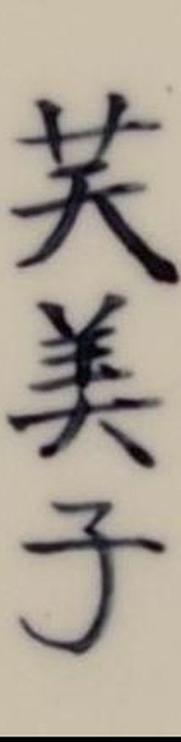芙美子
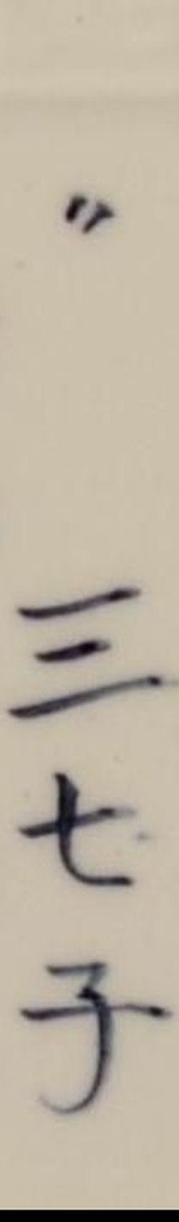三七子
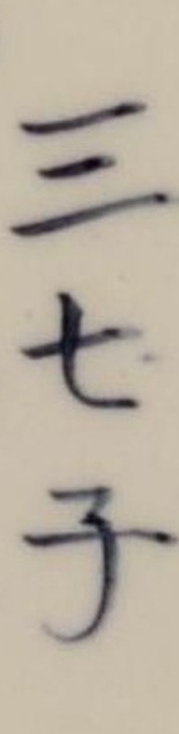三七子
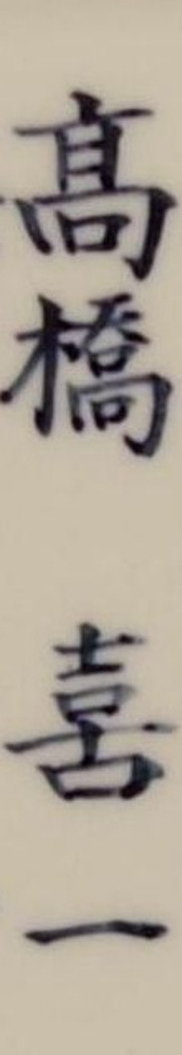高橋喜一
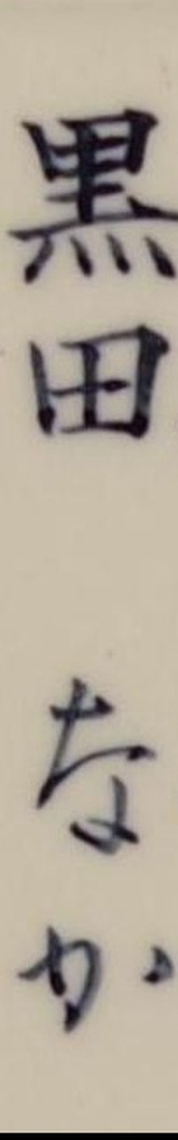黒田なか
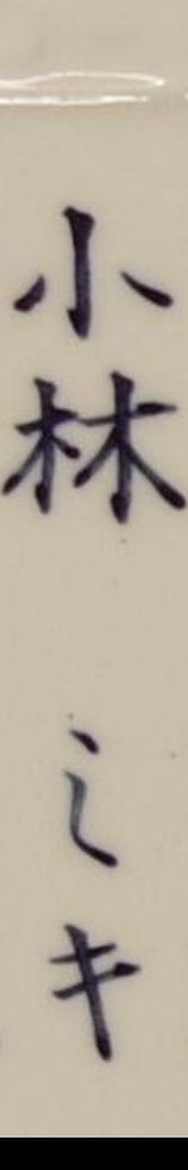小林ミキ
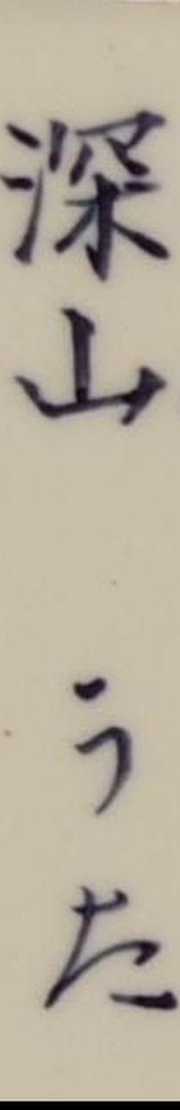深山うた
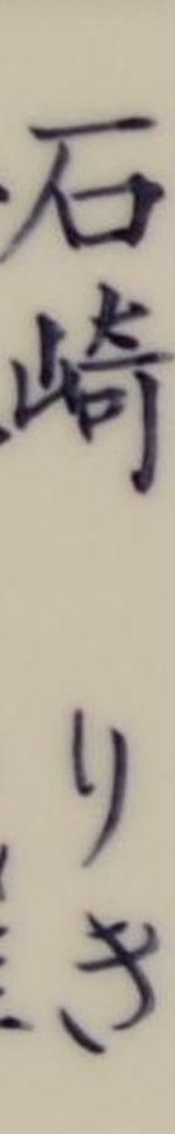石崎りき
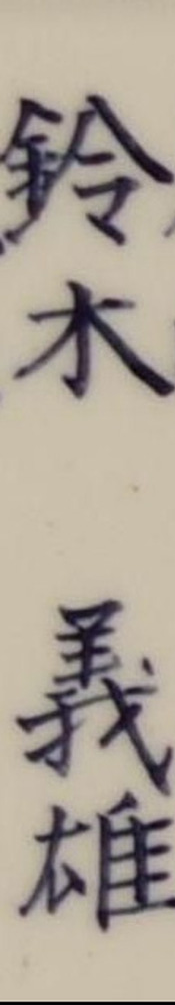鈴木義雄
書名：M~S
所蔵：高野山金剛峯寺
